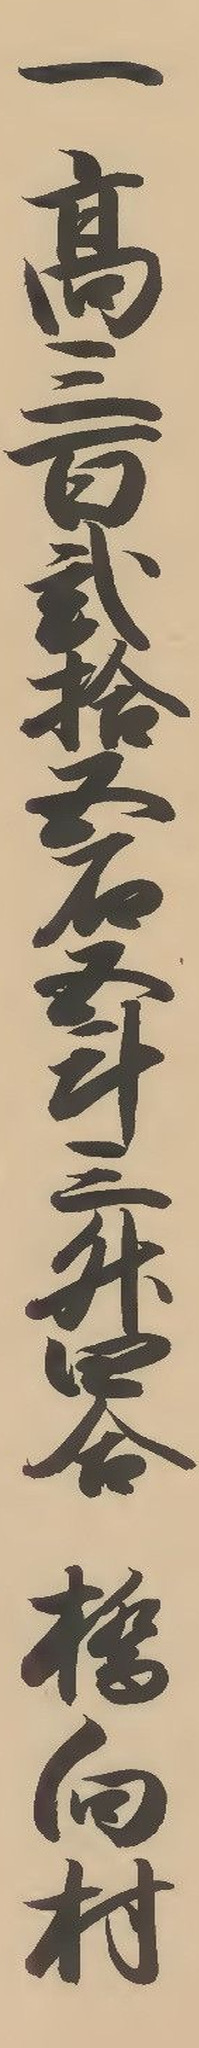一高三百弐拾五石五斗三升四合橋向村
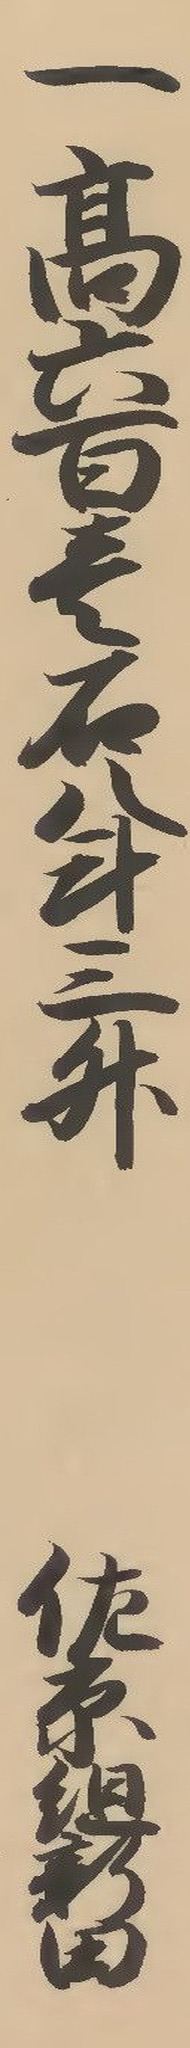一高六百壱石八斗三升佐原組新田
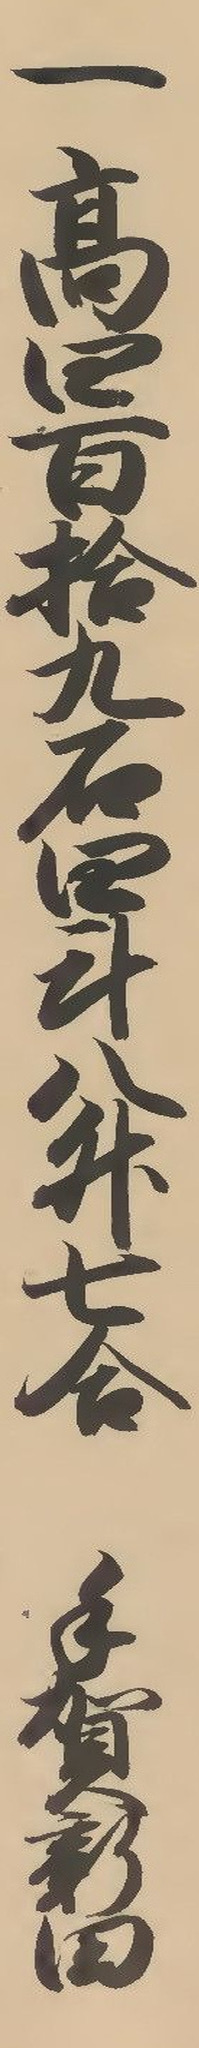一高四百拾九石四斗八升七合手賀新田
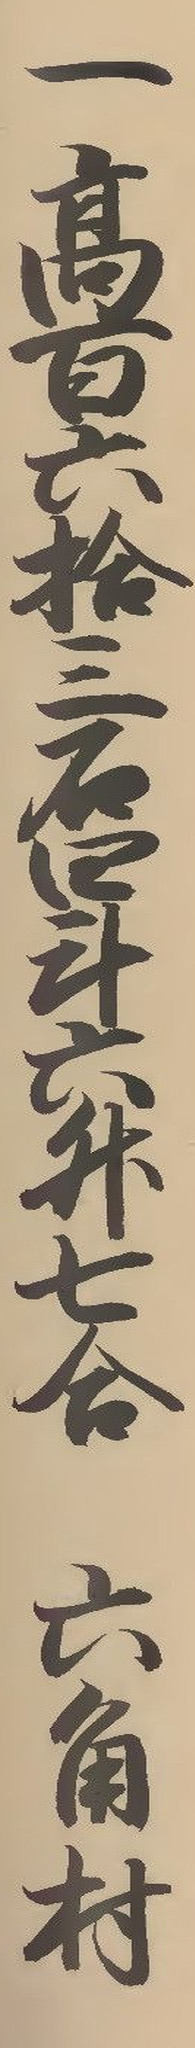一高百六拾三石四斗六升七合六角村
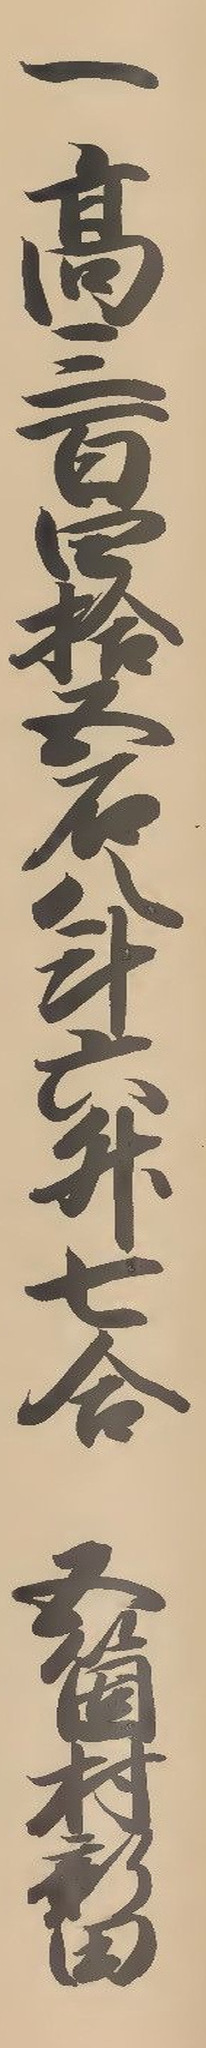一高三百四拾五石八斗六升七合五箇村新田
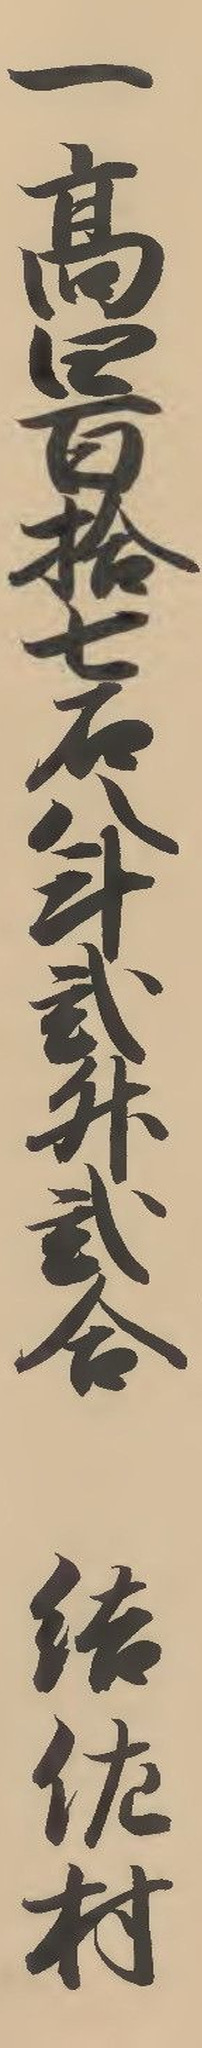一高四百拾七石八斗弐升弐合結佐村
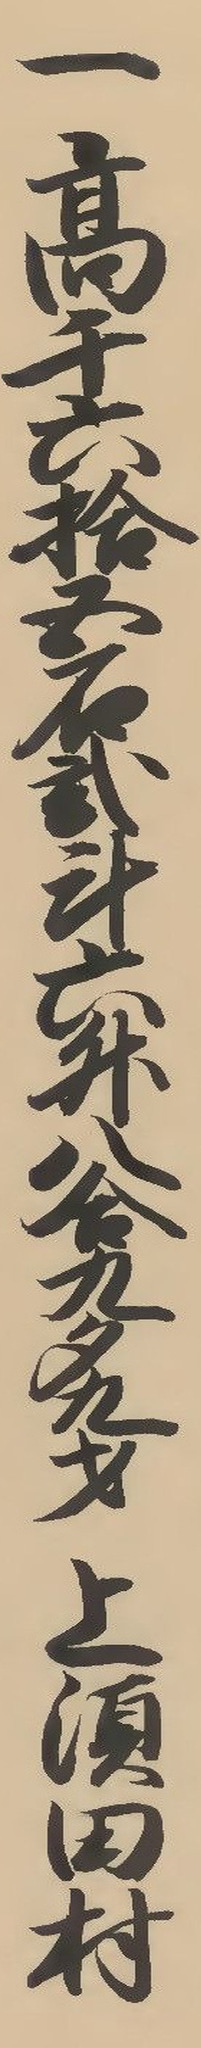一高千六拾五石弐斗六升八合九勺九才上須田村
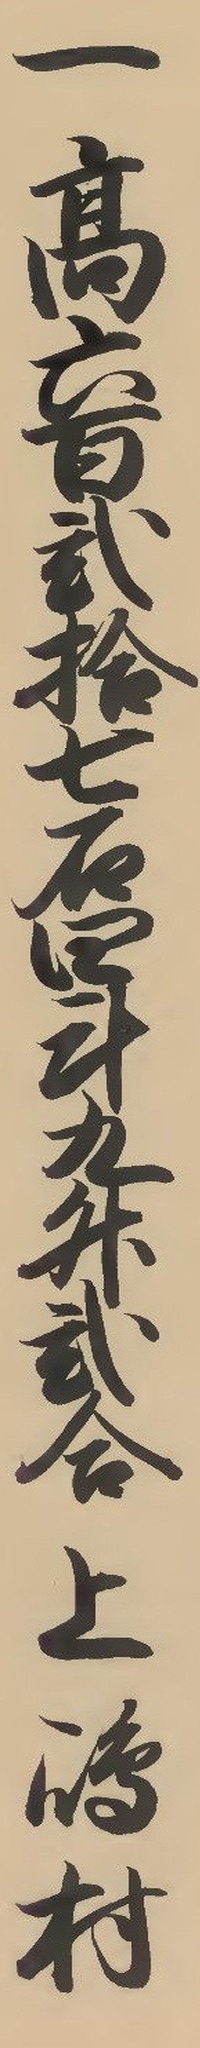一高六百弐拾七石四斗九升弐合上島村

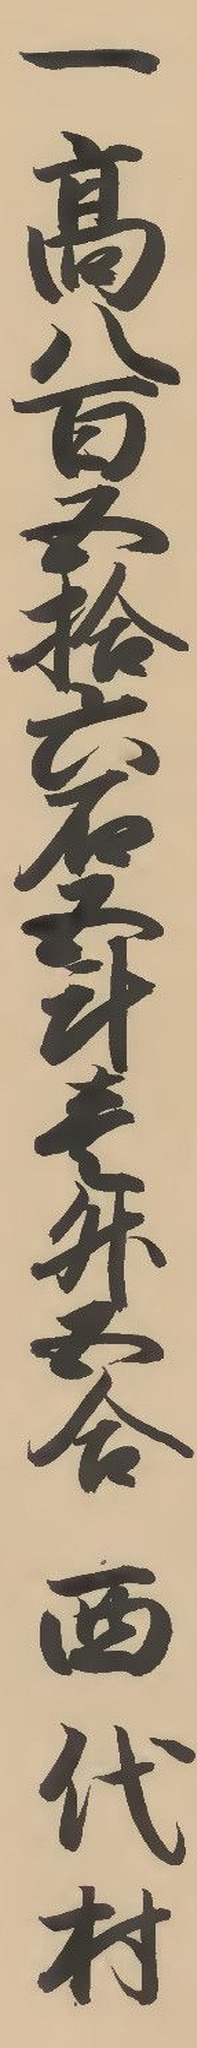一高八百五拾六石五斗壱升五合西代村
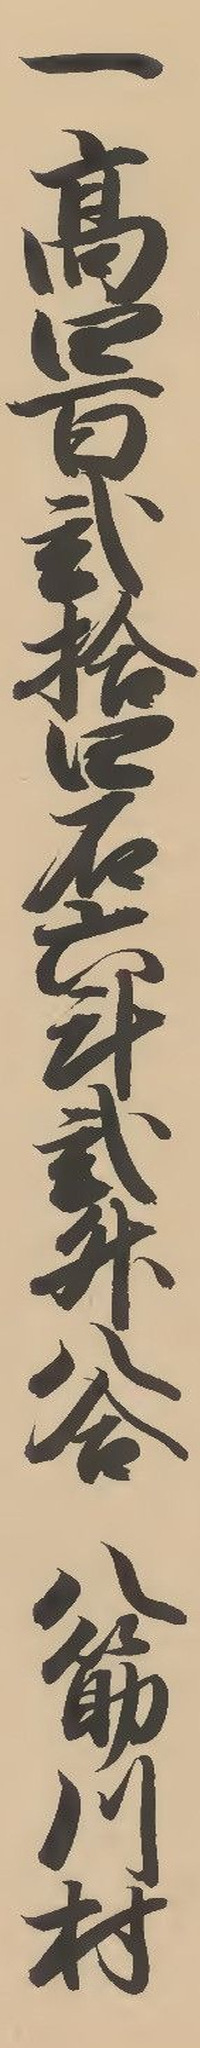一高四百弐拾四石六斗弐升八合八筋川村
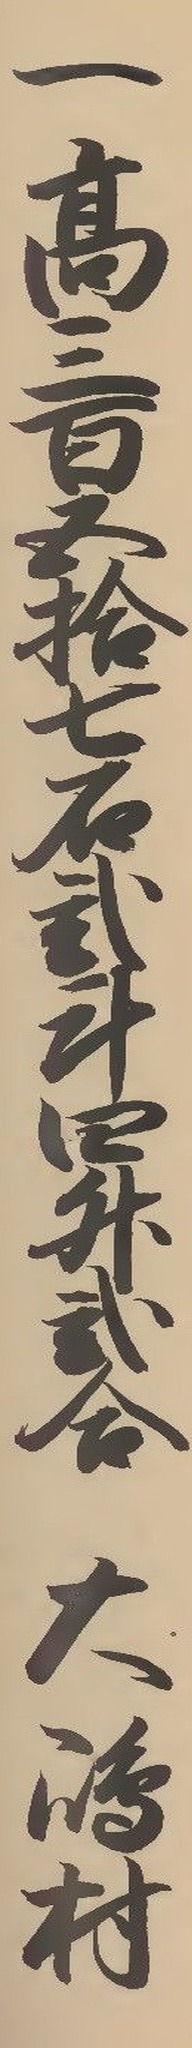一高三百五拾七石弐斗四升弐合大島村
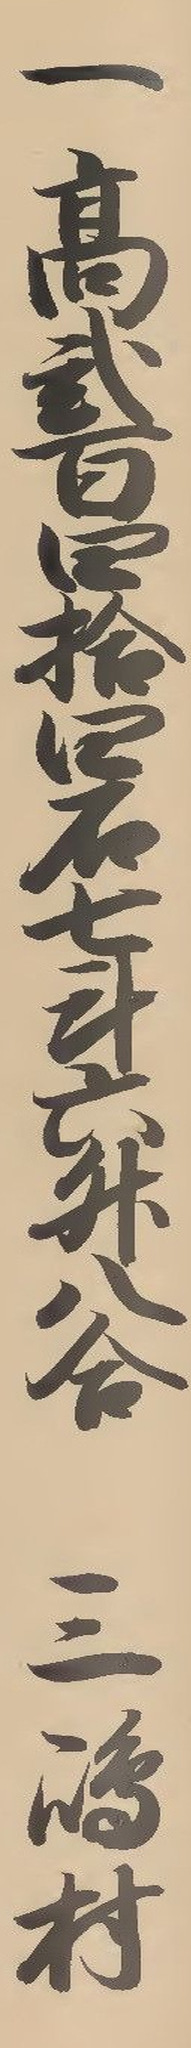一高弐百四拾四石七斗六升八合三島村
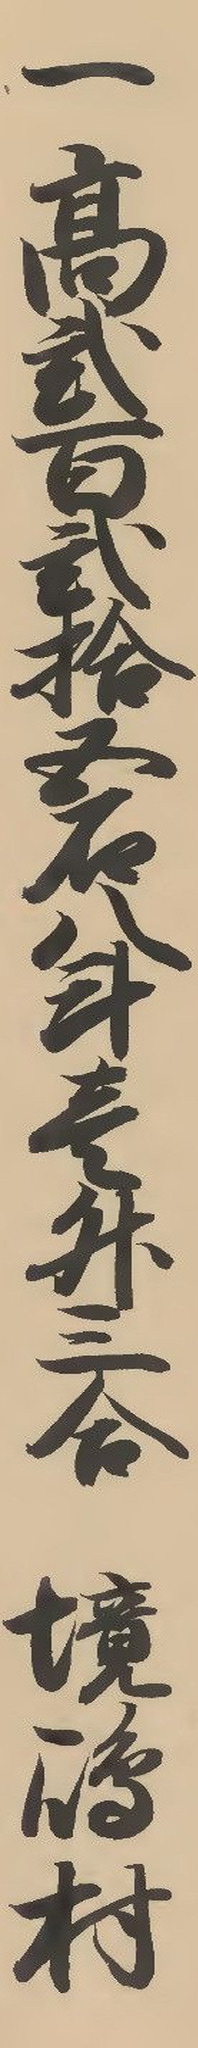一高弐百弐拾五石八斗壱升三合境島村
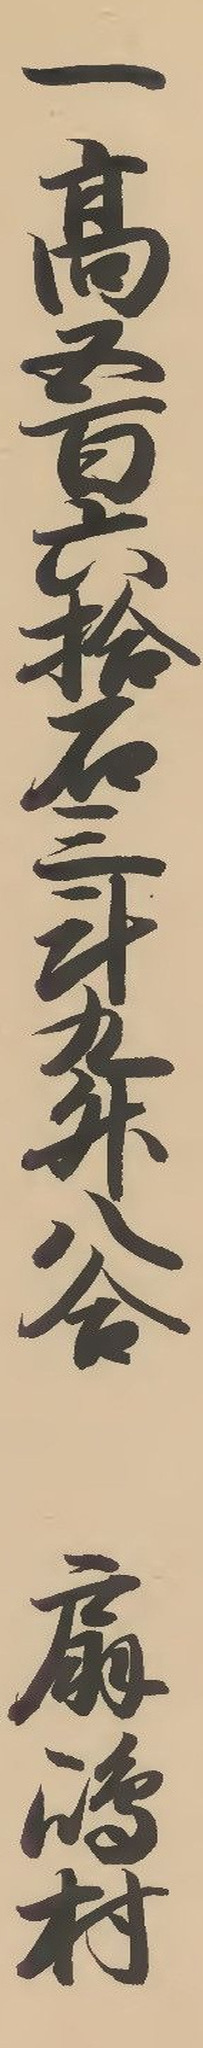一高五百六拾石三斗九升八合扇島村
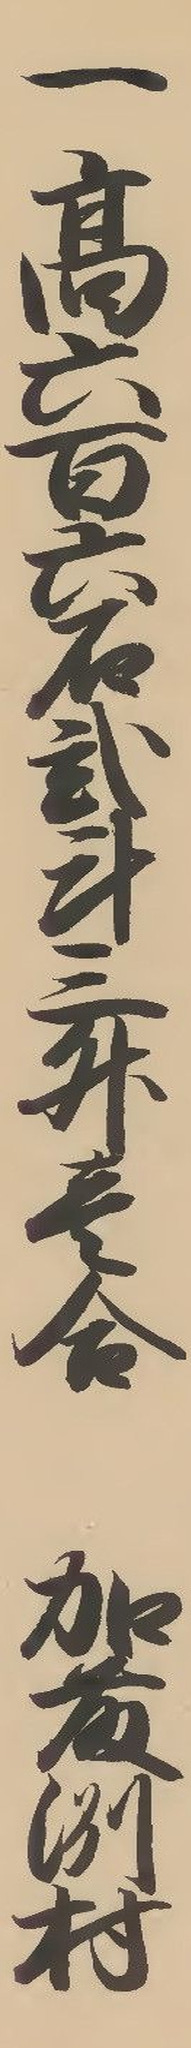一高六百六石弐斗三升壱合加藤洲村

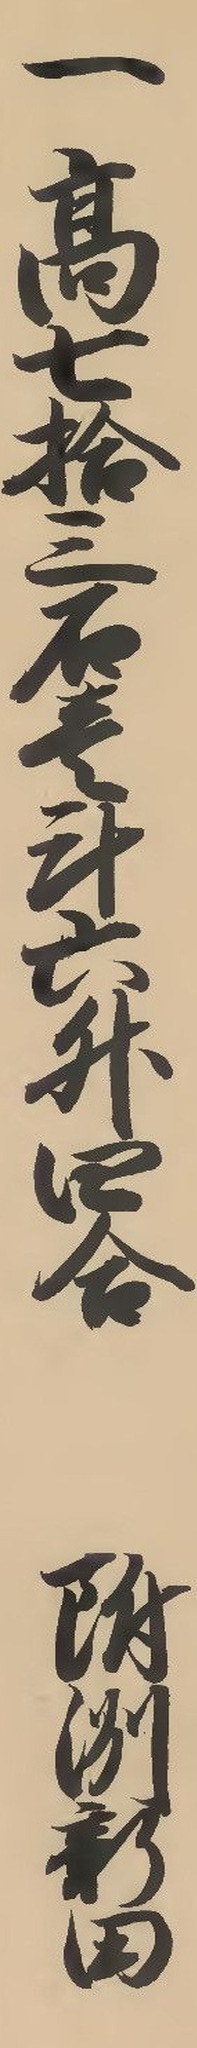一高七拾三石壱斗六升四合附洲新田
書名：下総国郷帳
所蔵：国立公文書館 National Archives of Japan
